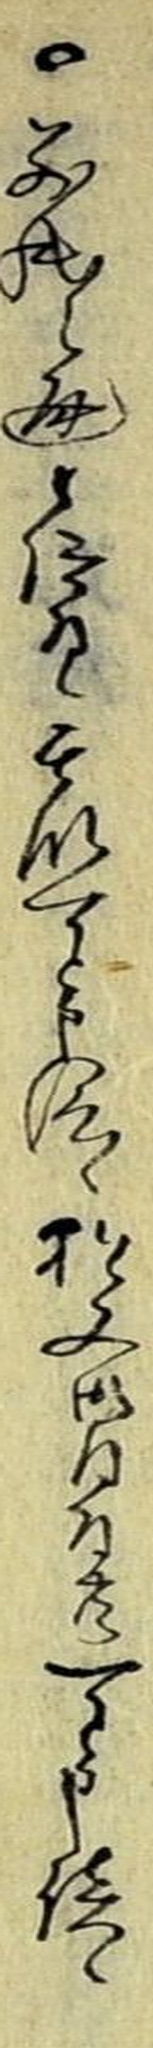○別紙之通被仰付候其段可被申渡候猶又御目付共可被申談候
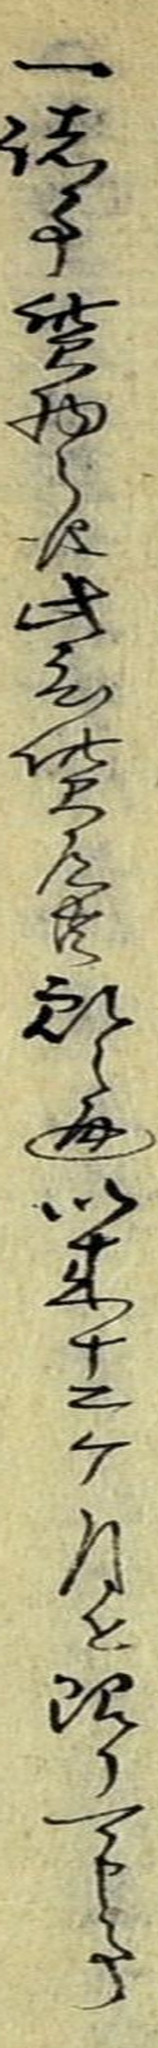一諸事質物之儀此度質屋共願之通以来十二ヶ月を限り可申事
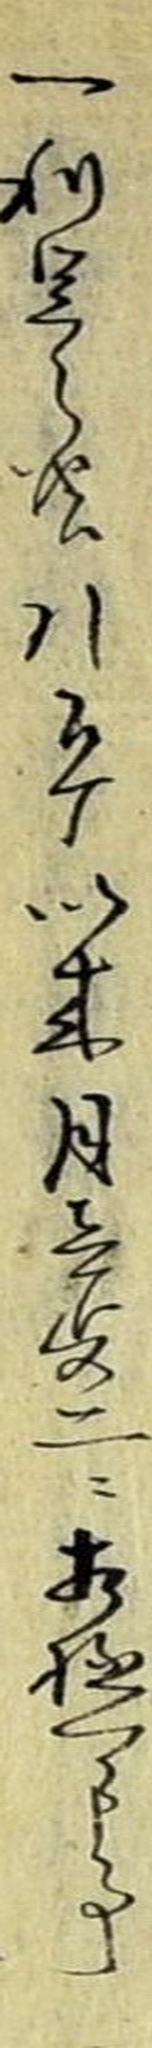一利足之儀は引下ヶ以来月壱歩二に相極可申事
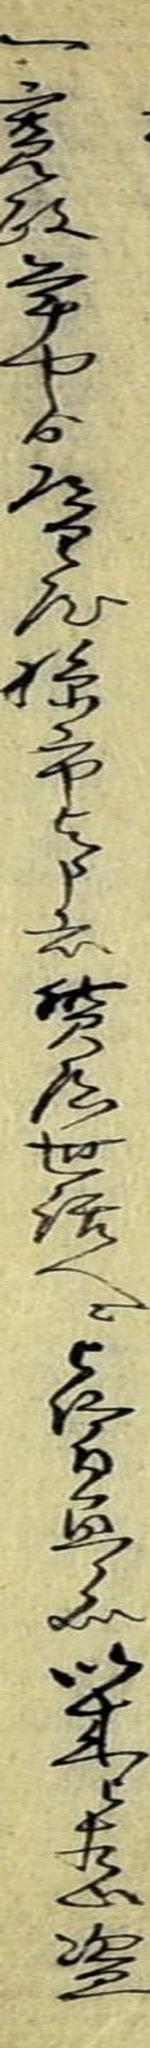一寛政年中ゟ道具屋孫市と申者質屋世話人に被仰付置候処以来被相止盗
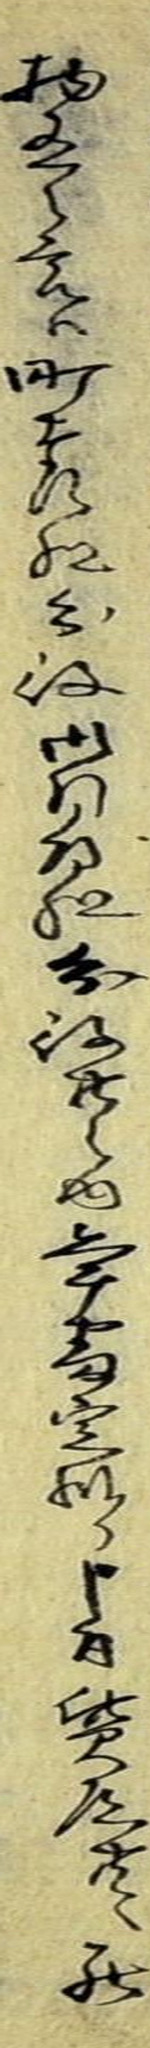物有之節は町奉行組分役御目付組分役共之内年番定掛り申付質屋共へ罷
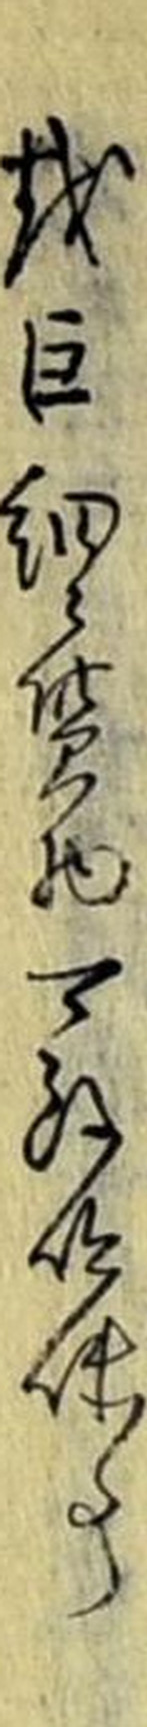越巨細質物可致吟味事
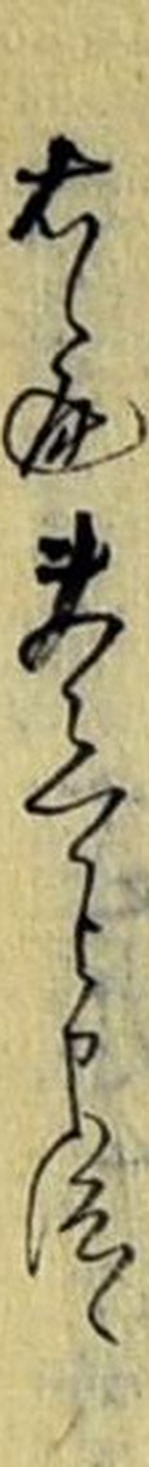右之通夫々可被被申渡候

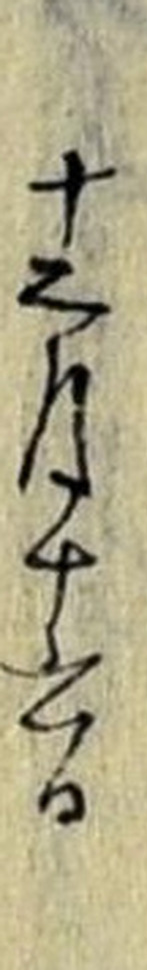十二月十六日
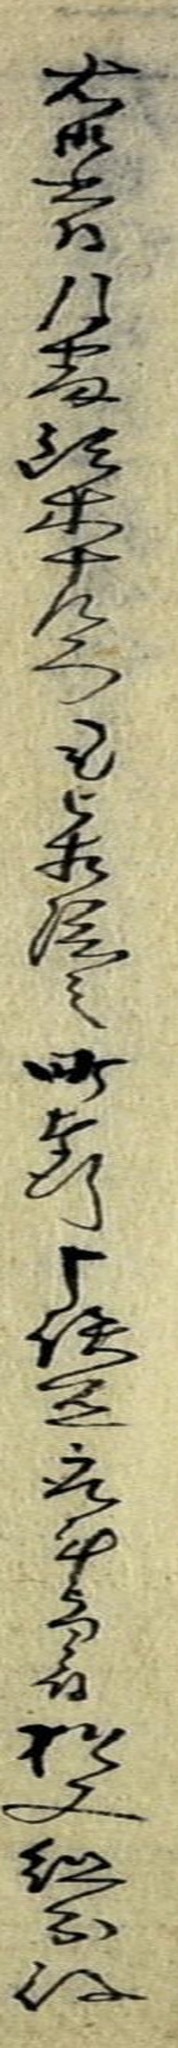右御書付月番鈴木十左衛門へも被相渡之町奉行申談宜取斗旨に付猶又組分役
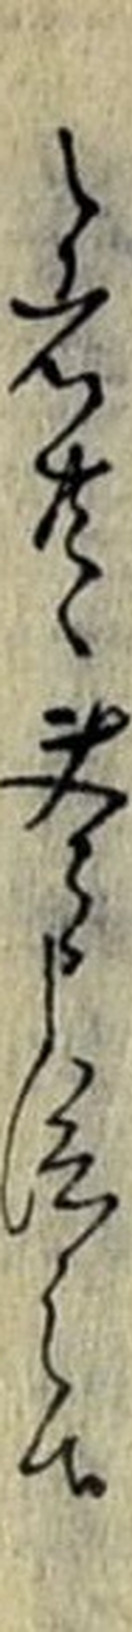之者共へ夫々申渡之候
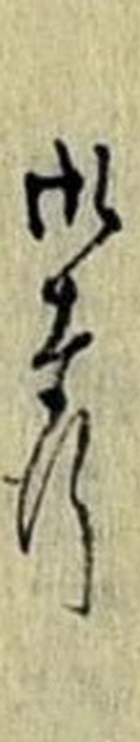御奉行
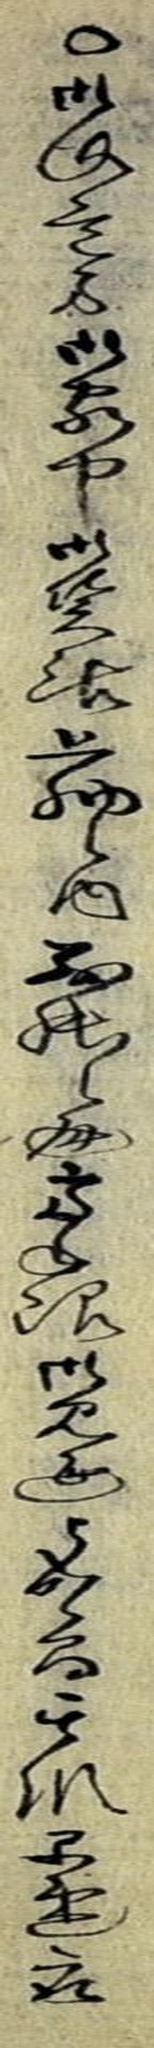○御趣意方御家中御貸銀上納之内別紙之通当年銀御見延被成候間其段早速取
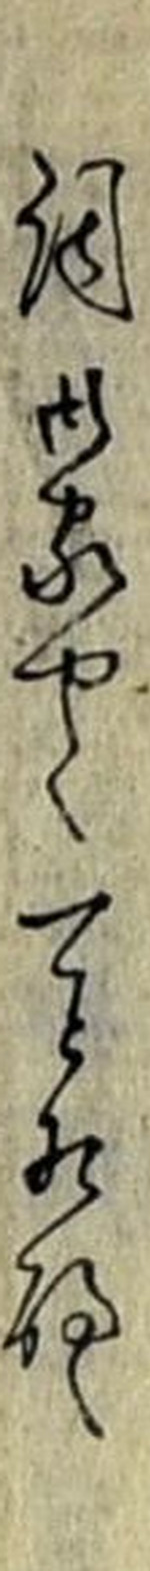調御家中へ可被相触候
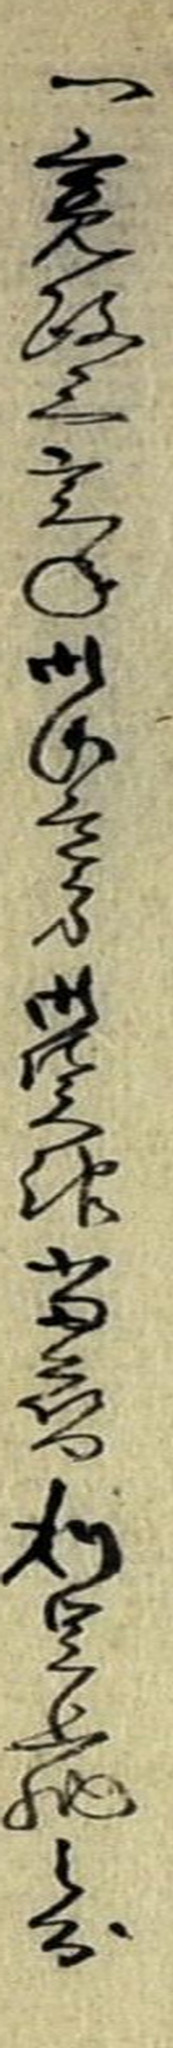一寛政三亥年御趣意方御貸銀当暮利足上納之分
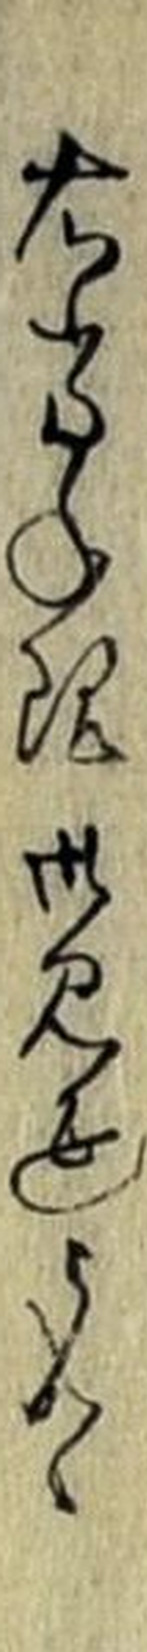右当年銀御見延被成候
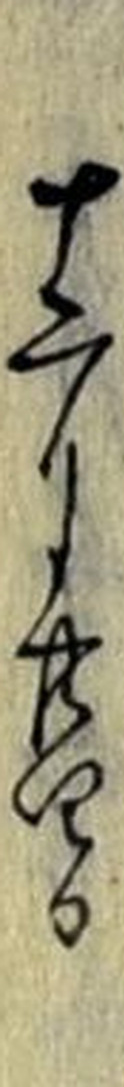十二月廿四日
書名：命令之部 四
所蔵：福井県文書館 Fukui Prefectural Archives
